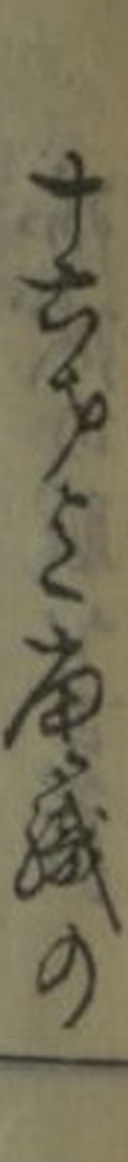十六才は唐織の
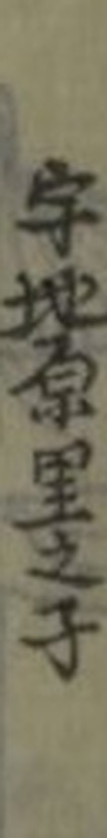宇地原里之子
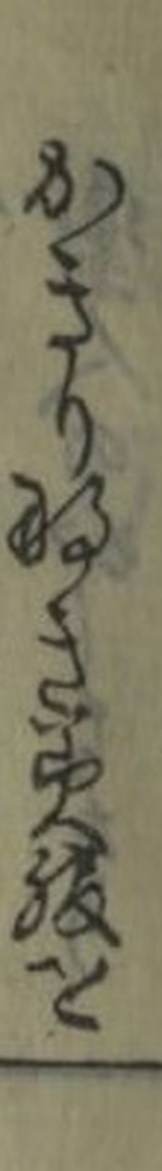かきりなき美服を
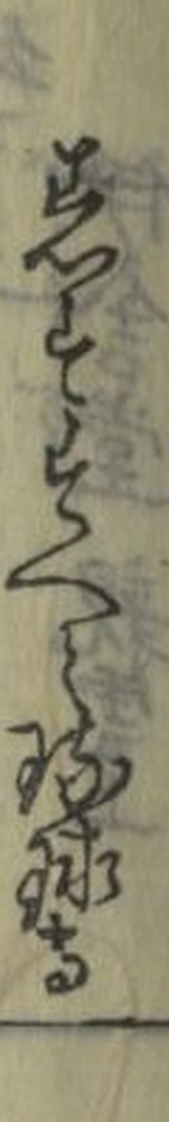着すすへて琉球高
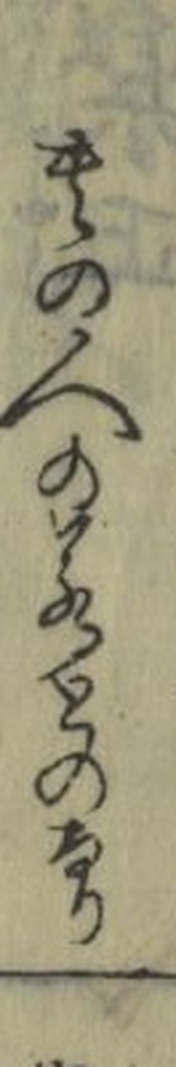貴の人の若とのなり
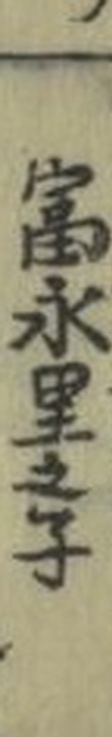富永里之子
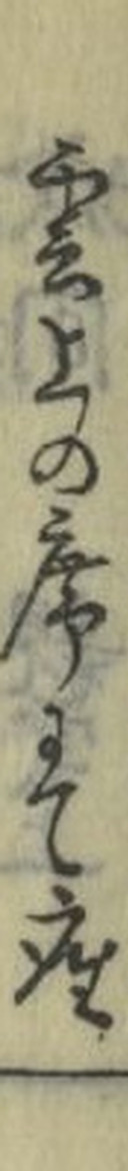雲上の席にて座
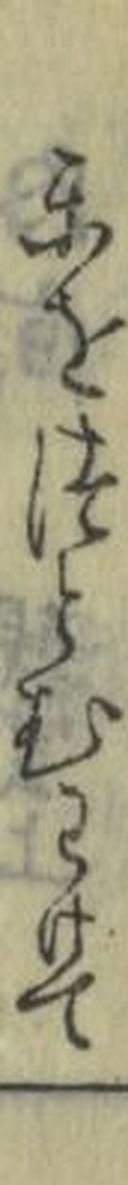楽をつとむわけて
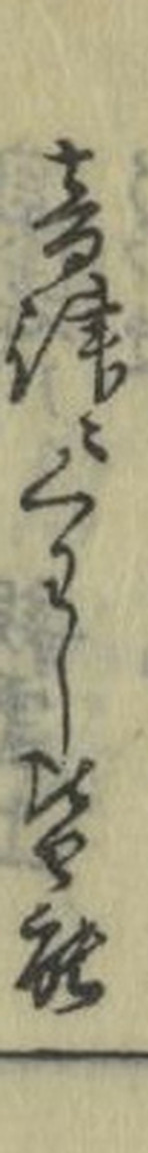音律にくわし皆能
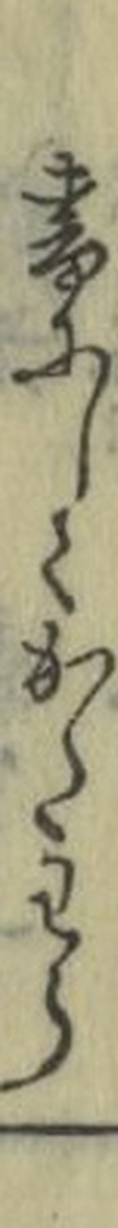書にしてかたわら
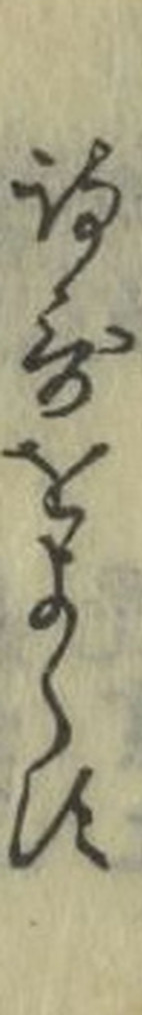詞歌をよらす
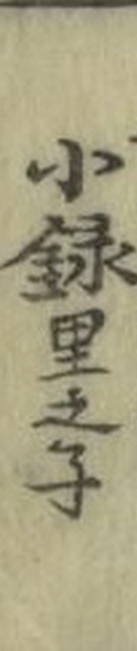小録里之子
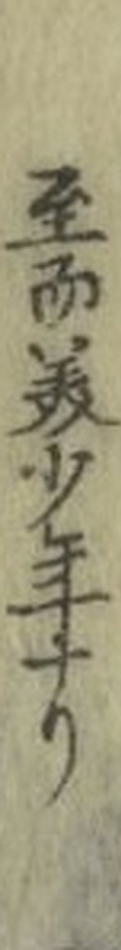至而美少年ナリ

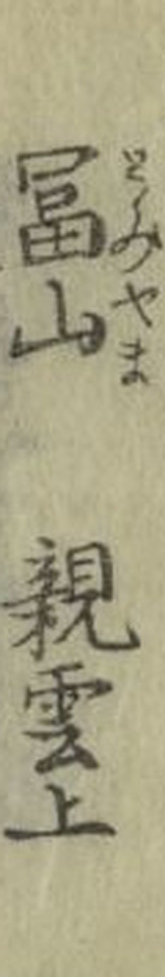冨山親雲上
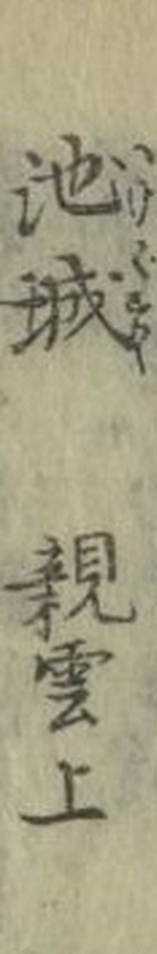池城親雲上
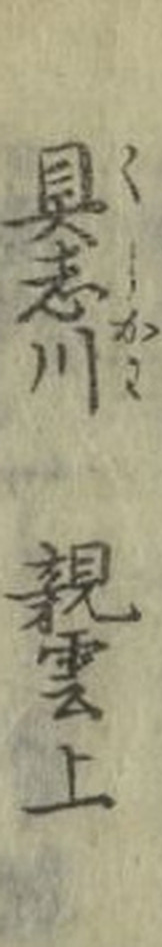具志川親雲上
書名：新板 琉球人行列記
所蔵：University of the Ryukyus Library
